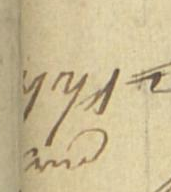-771
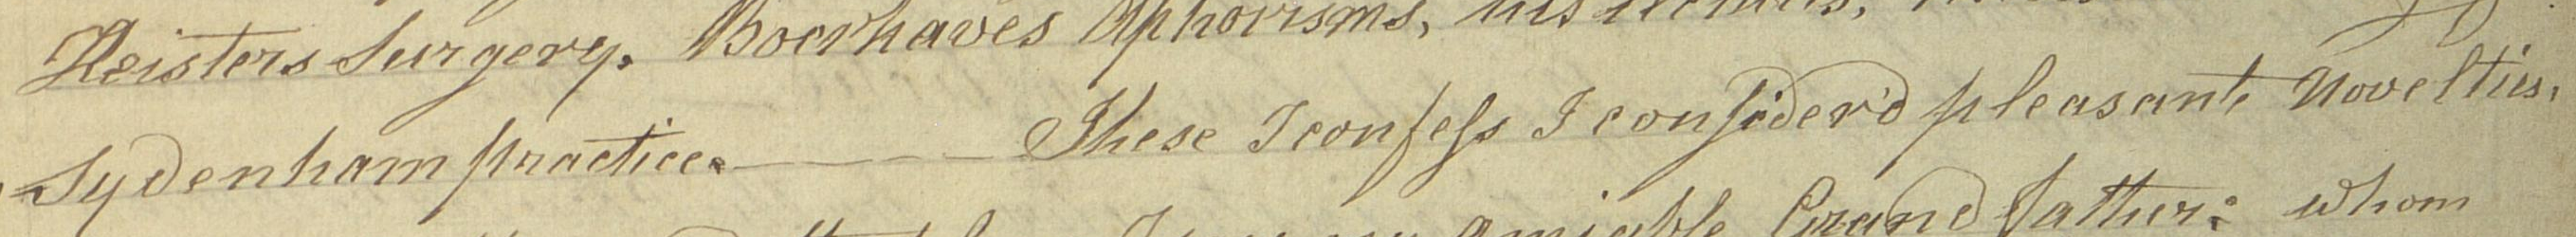Sydenham practice. These I confess I consider'd pleasant novelties
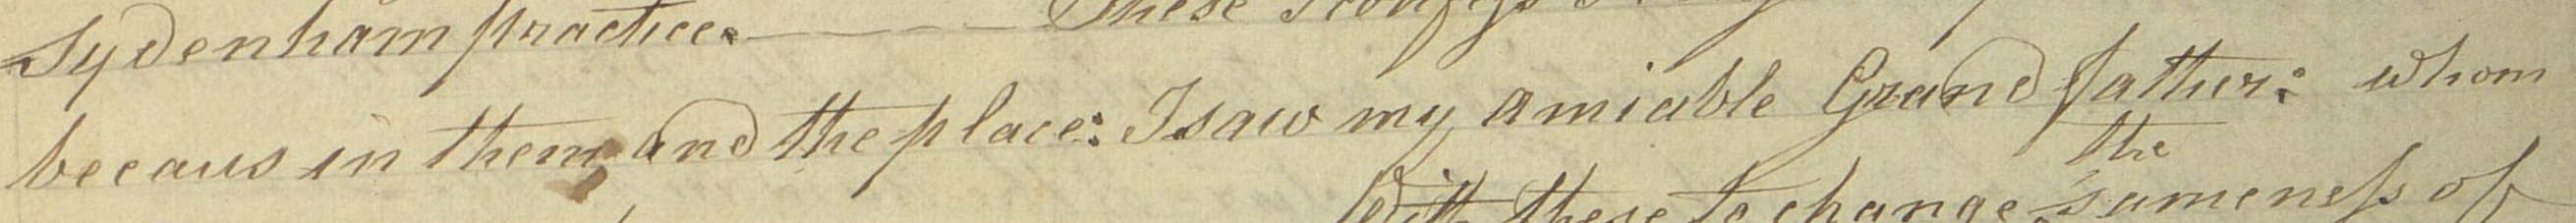becaus in them and the place: I saw my amiable Grand father: whom
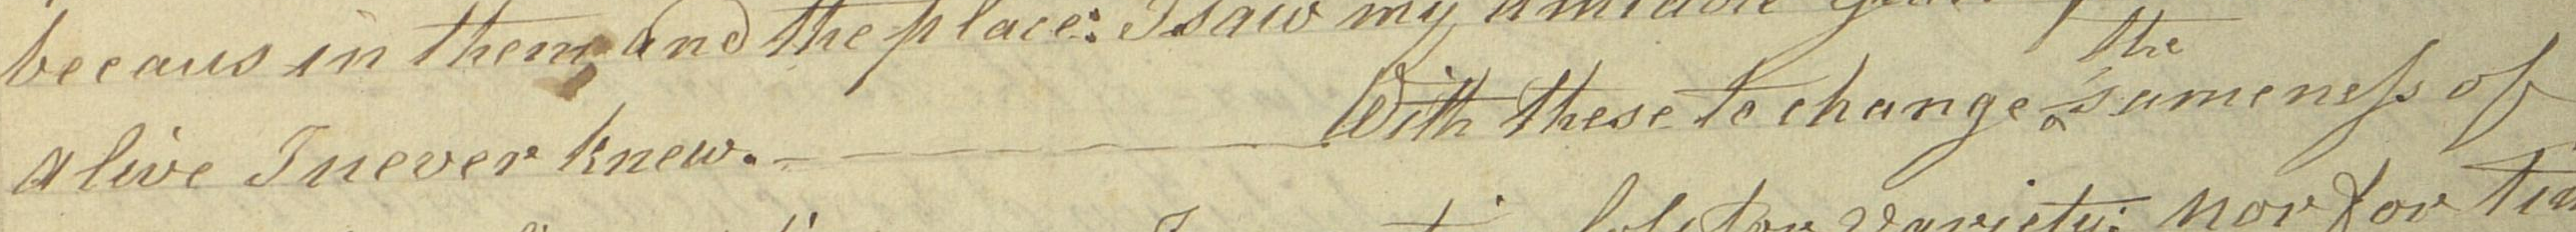alive I never knew. With these to change ^ sameness of
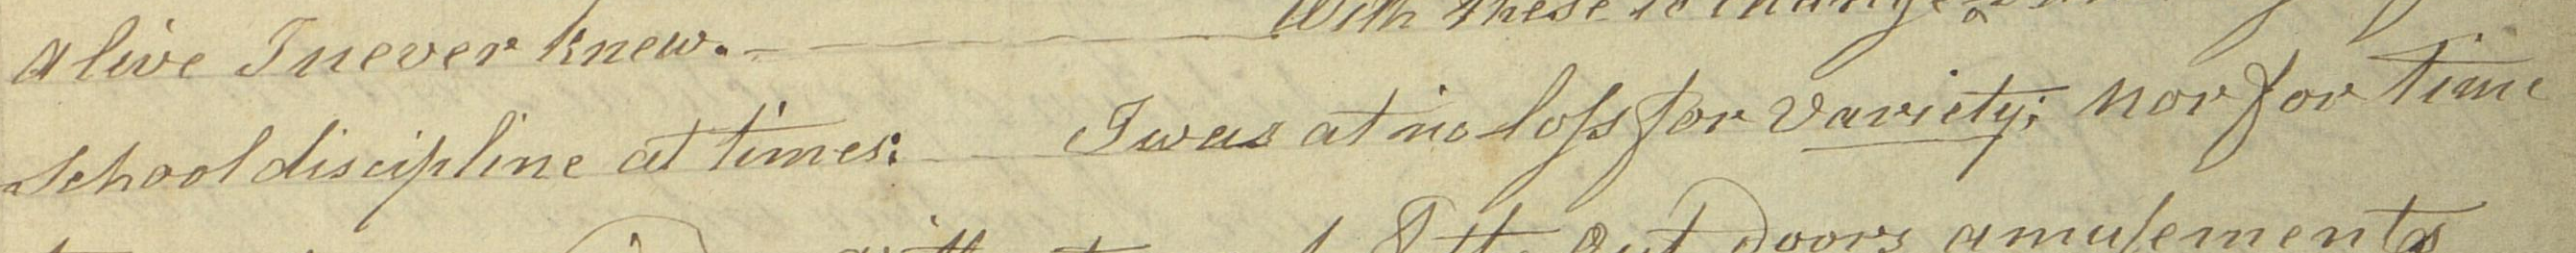school discipline at times: I was at no loss for variety nor for time
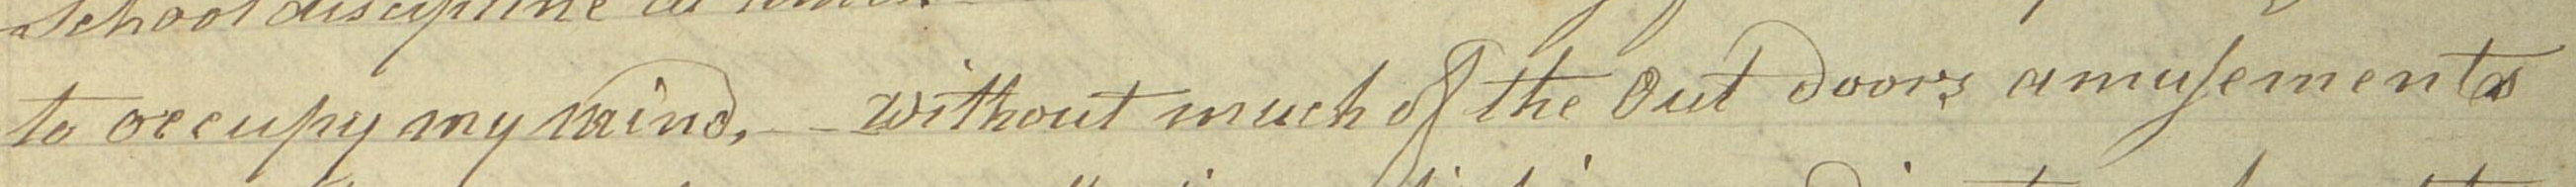to occupy my mind, Without much of the Out doors amusements
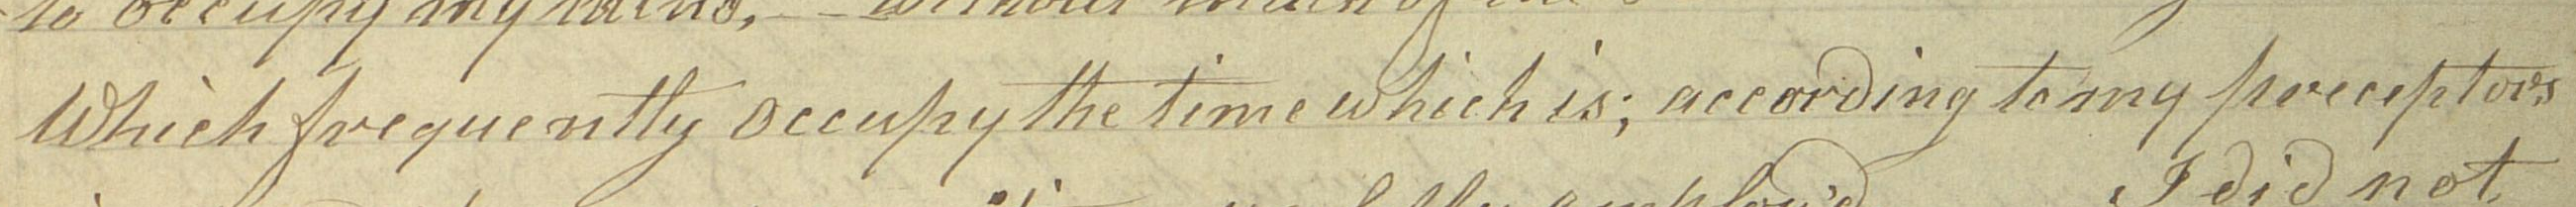Which frequently occupy the time which is; according to my preceptors
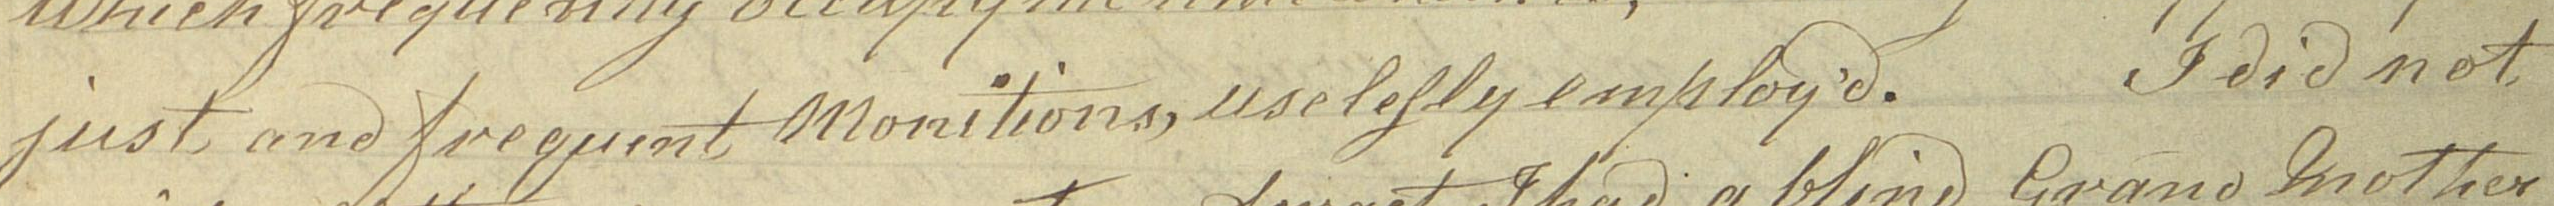just and frequent monitions, usefully employ'd. I did not
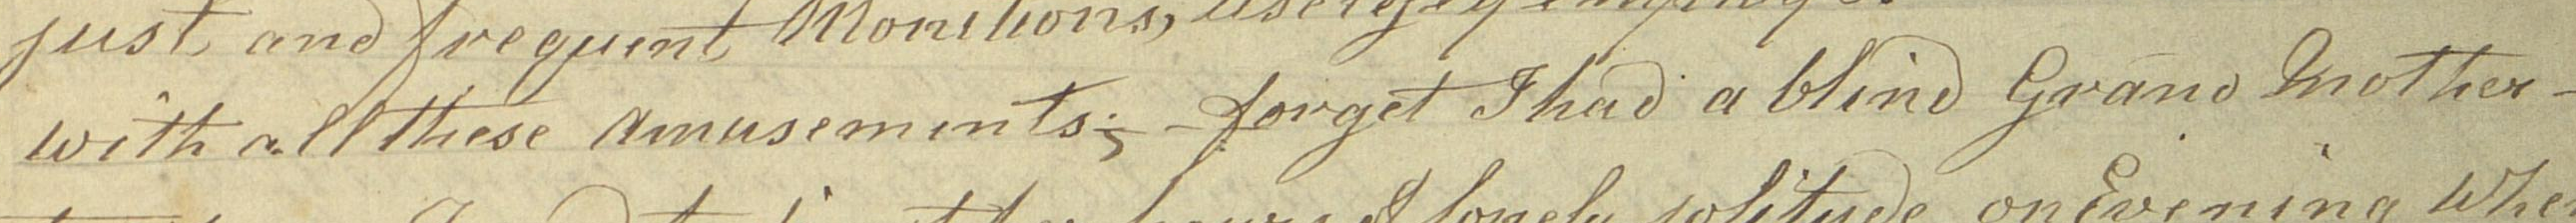with all these Amusements, forget I had a blind Grand mother
